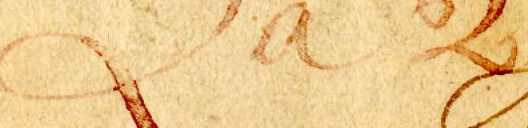La 2
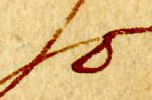To
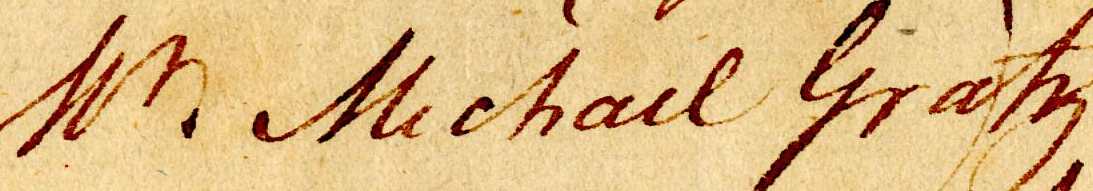M^r Michael Gratz
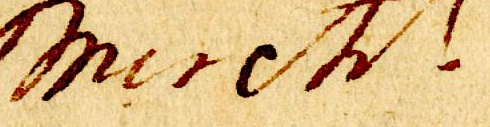Merch^t
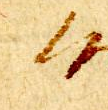in
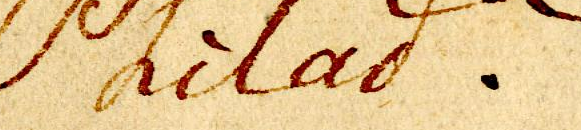Philad^a.
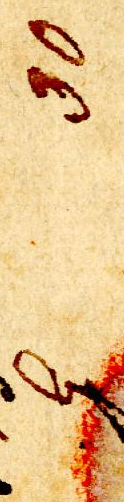G 30
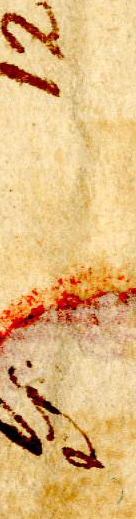I 12
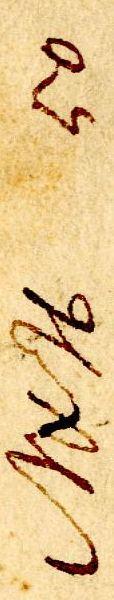N & H 50
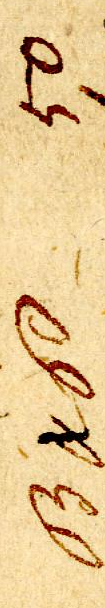B & P 50
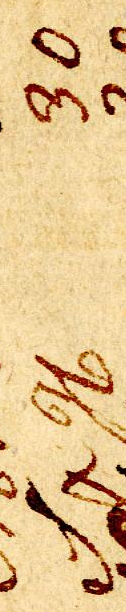I & H 30
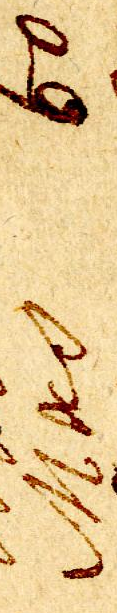M & S 50
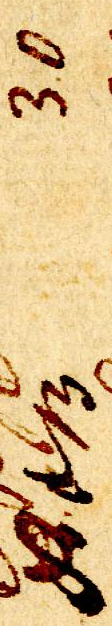S & B 30
